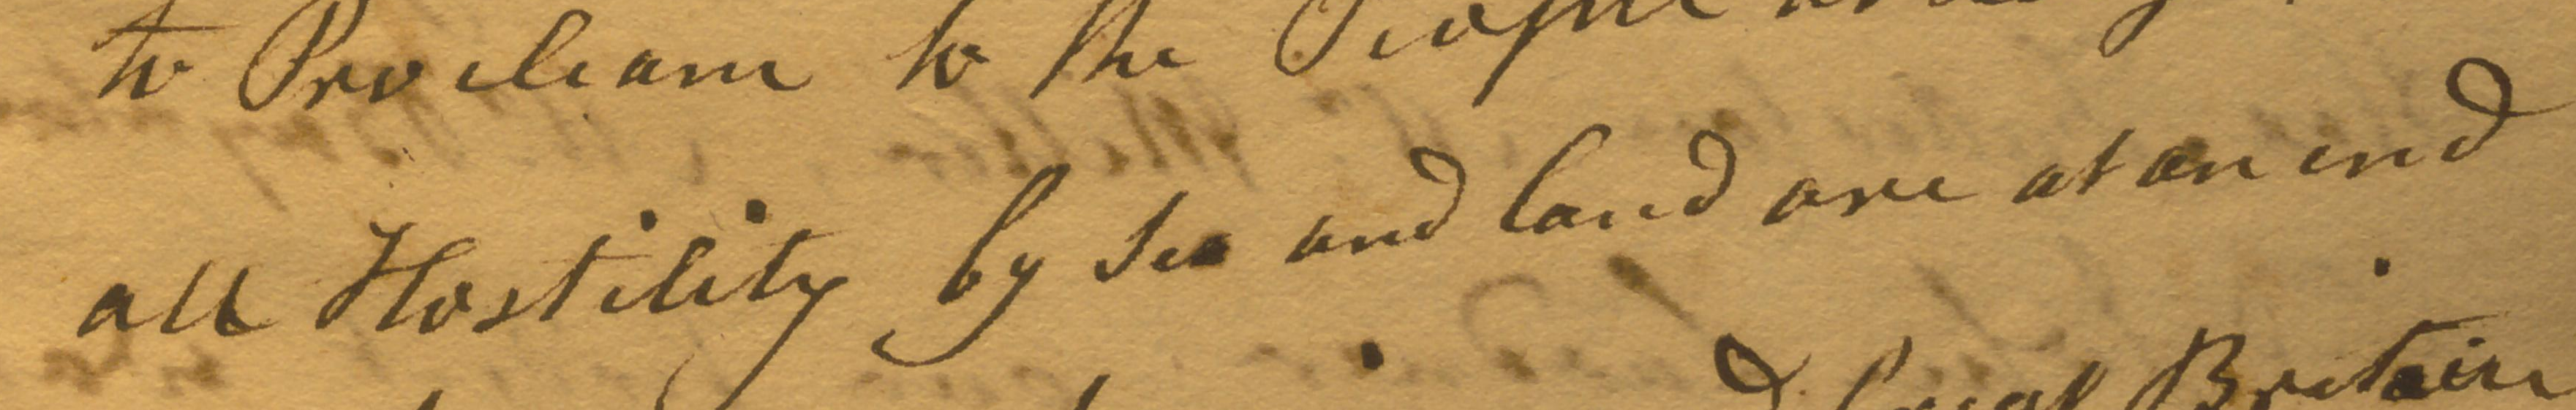all Hostility by sea and land are at an end
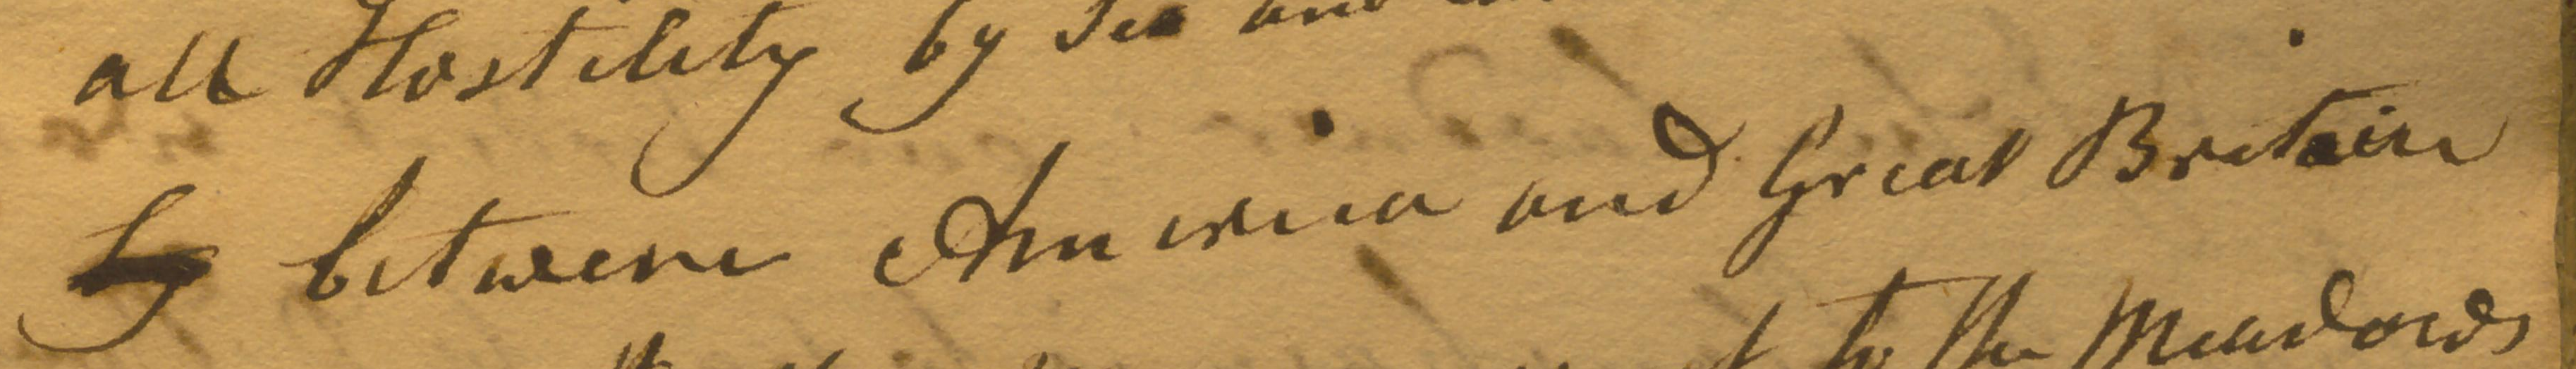[by] between America and Great Britain
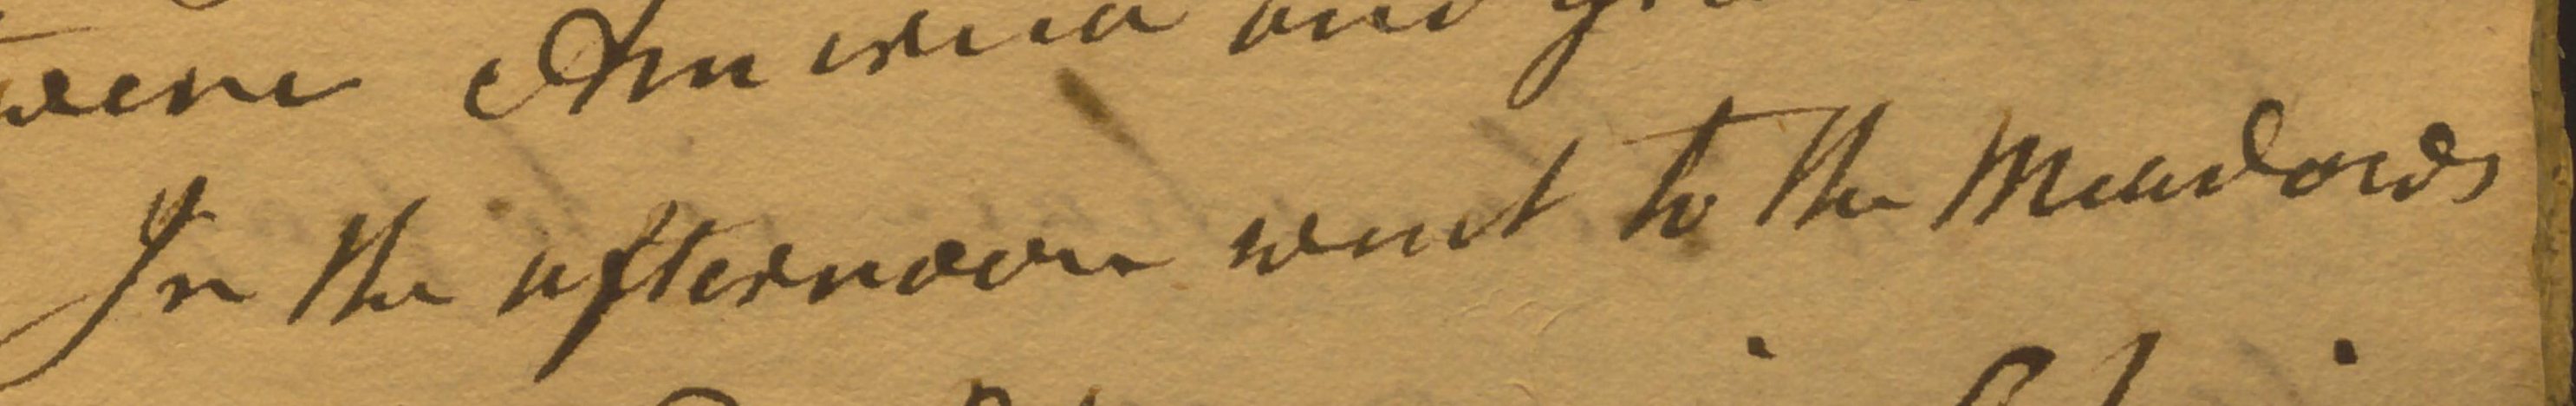In the afternoon went to the Meadows
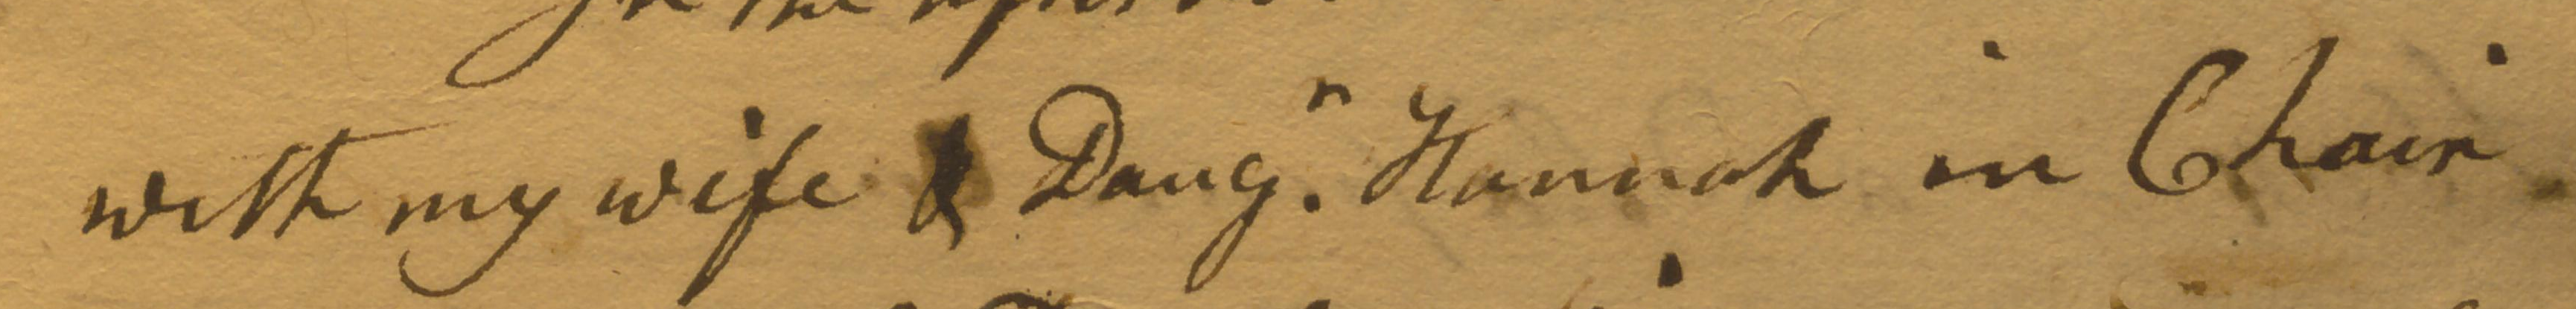with my wife & Daug^r. Hannah in Chair
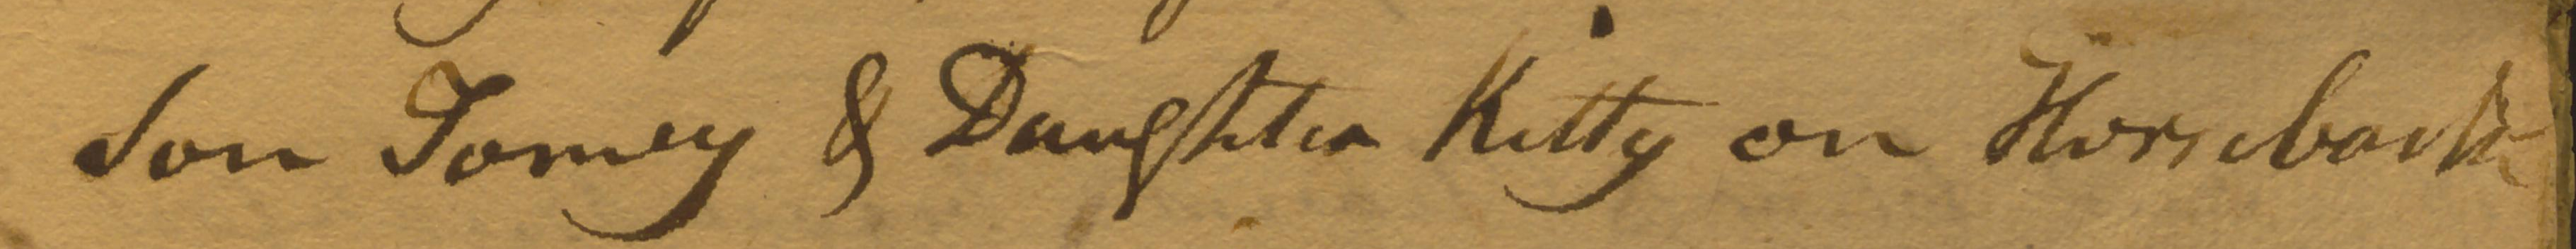Son Tomey & Daughter Kitty on Horseback
